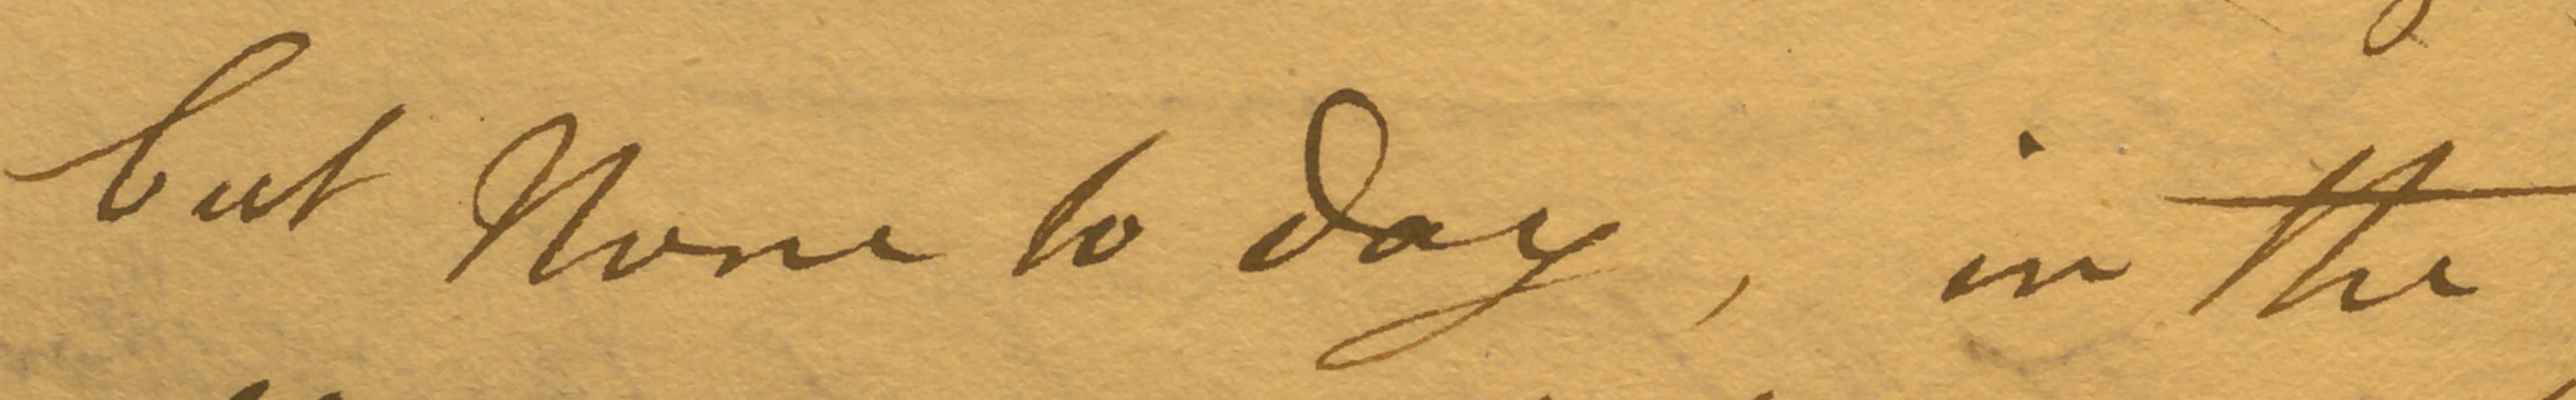but None to day, in the
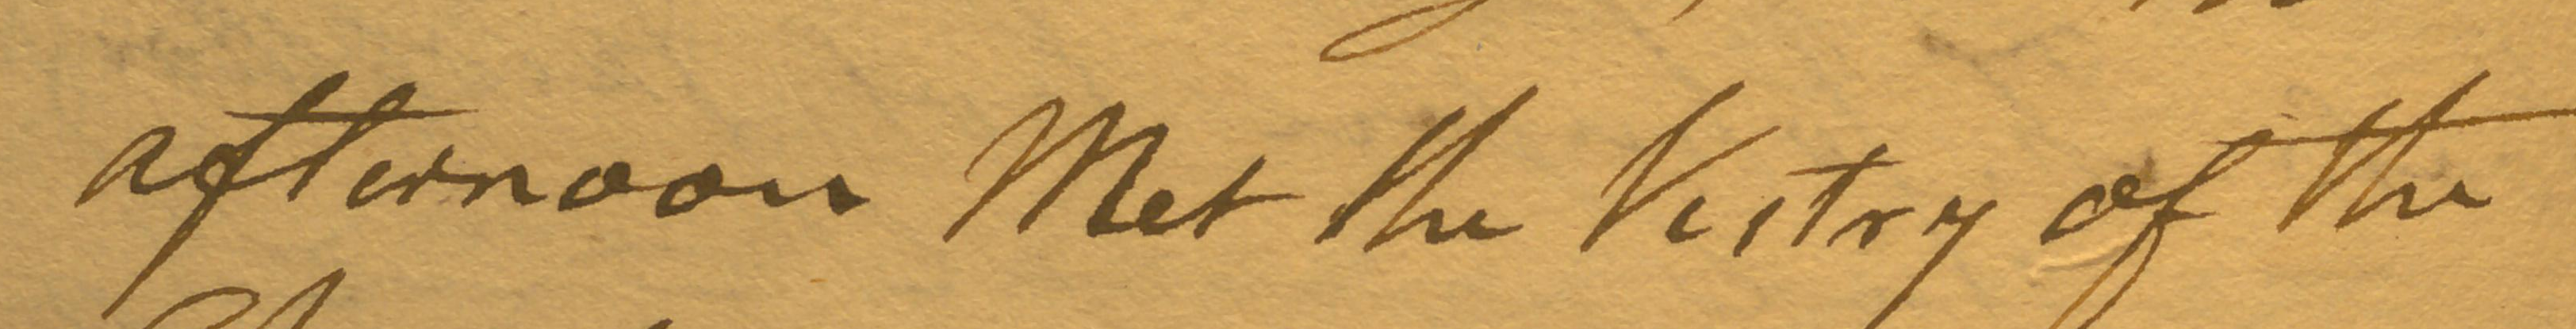afternoon Met the Vestry of the
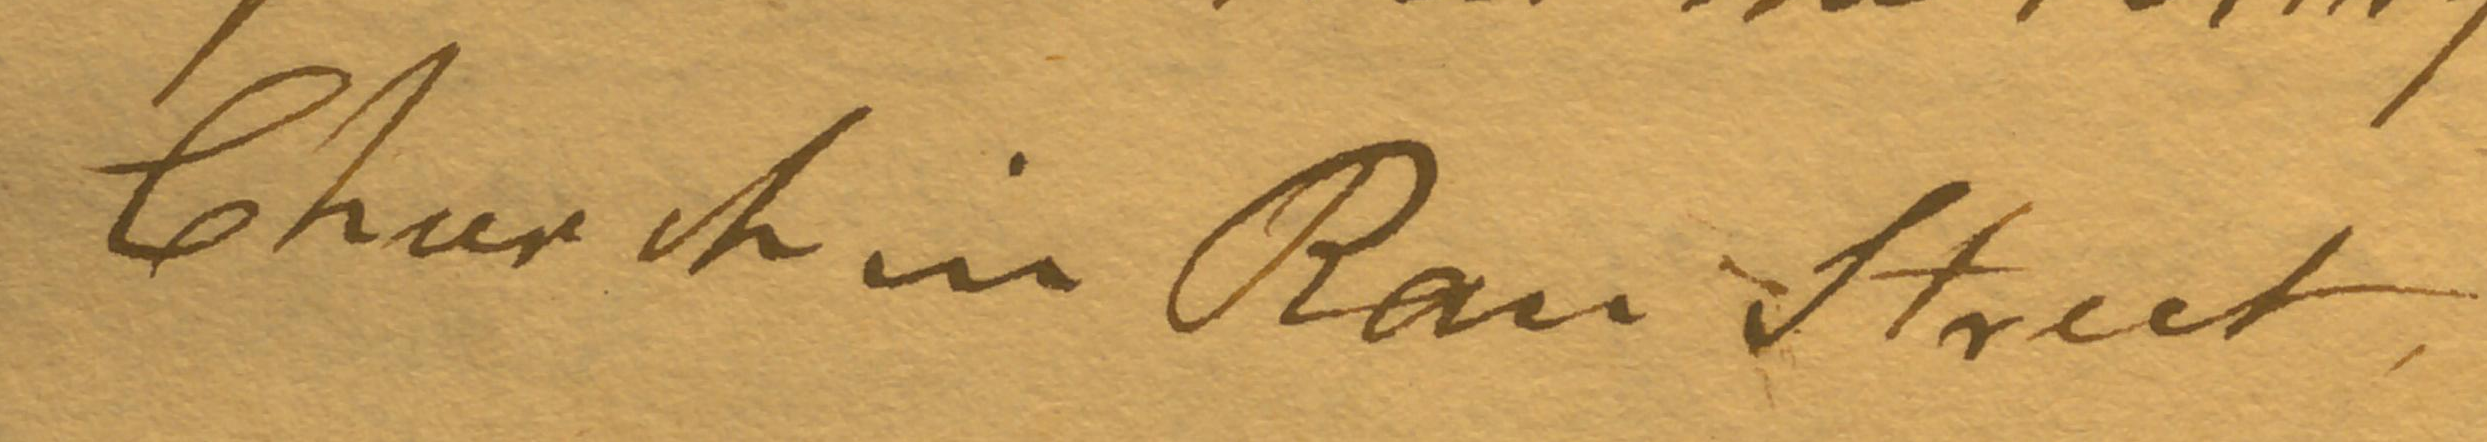Church in Race Street
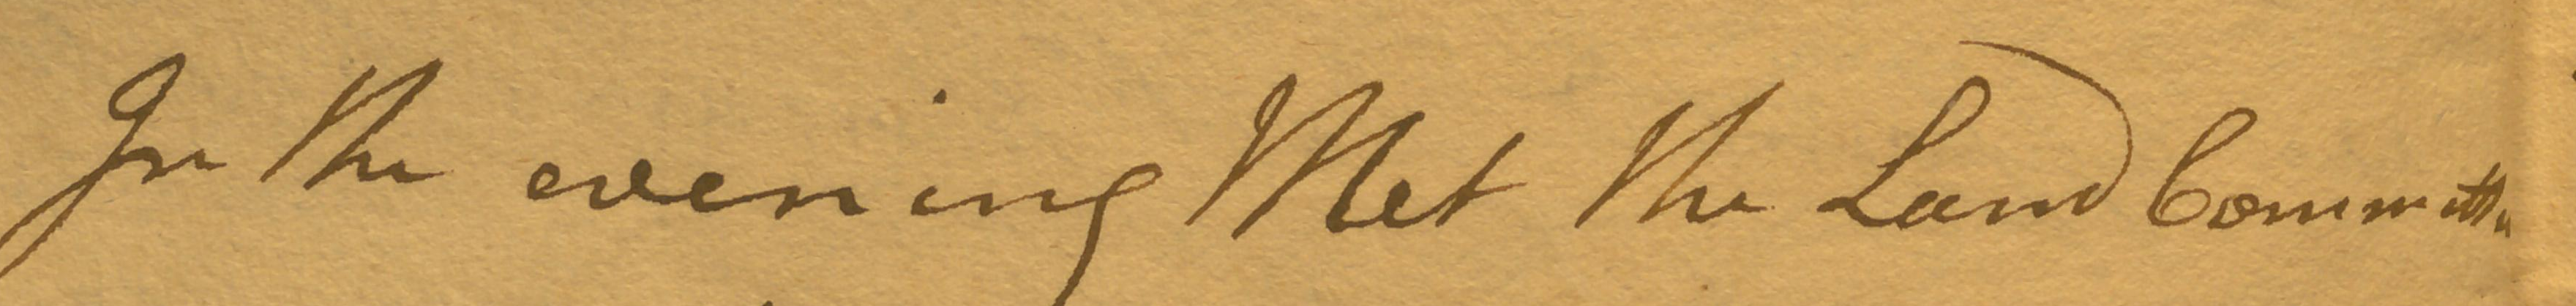In the evening Met the Land Committee
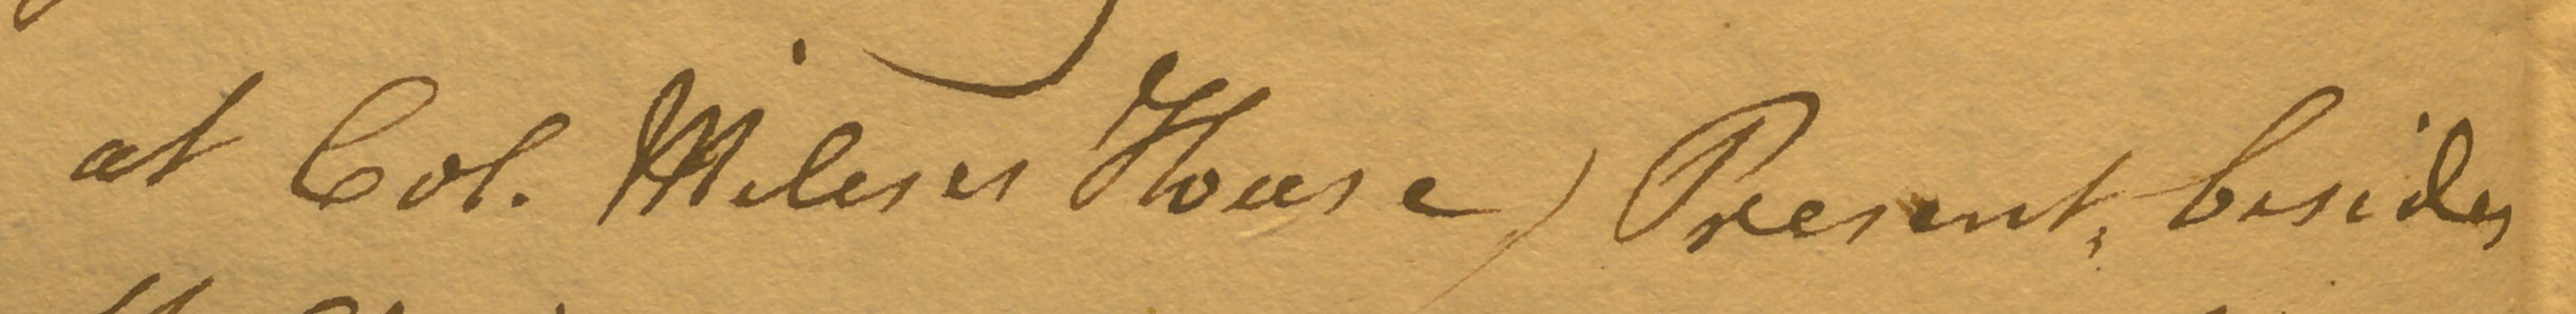at Col. Mileses House, Present, beside
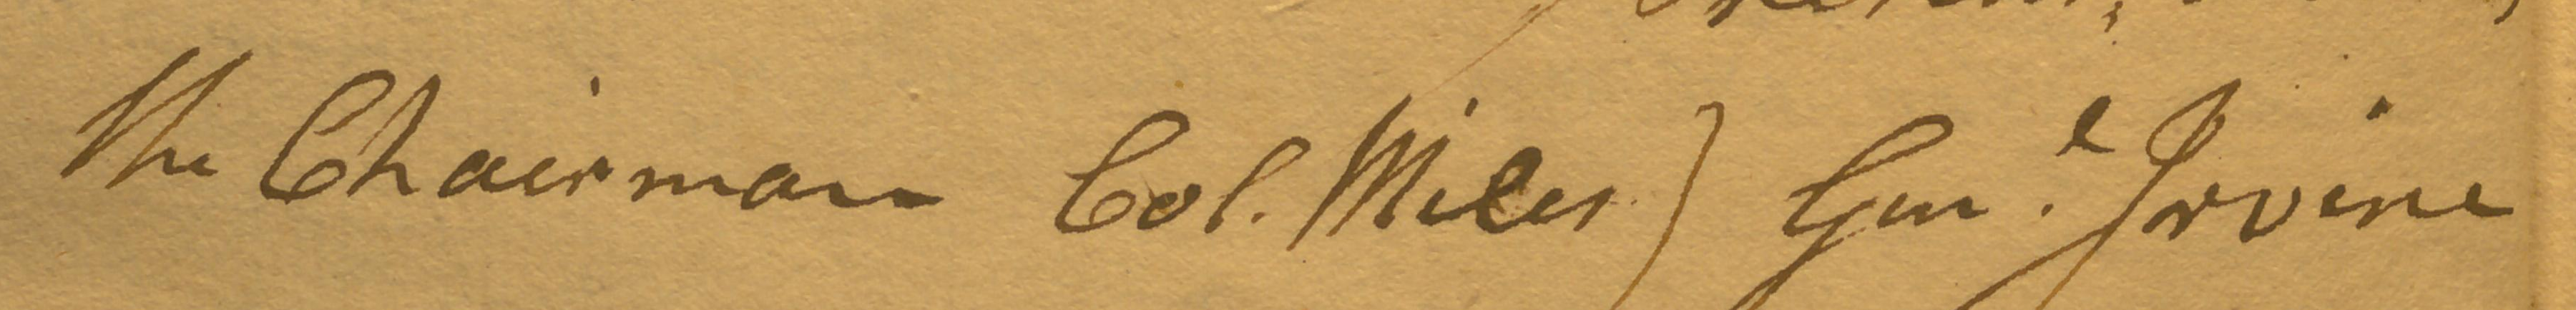the Chairman Col. Miles) Gen^l. Irvine
